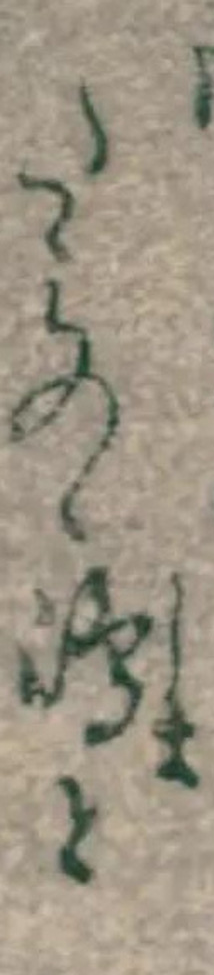たみのゝ嶋と
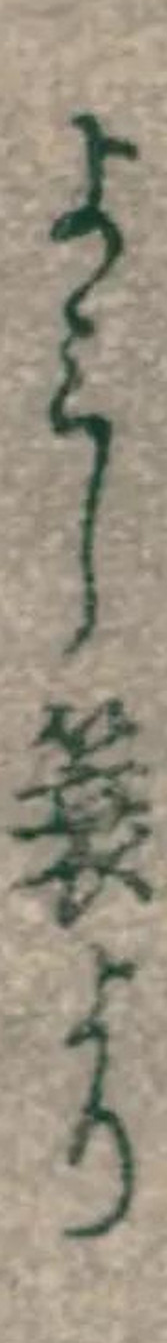よみし蓑より
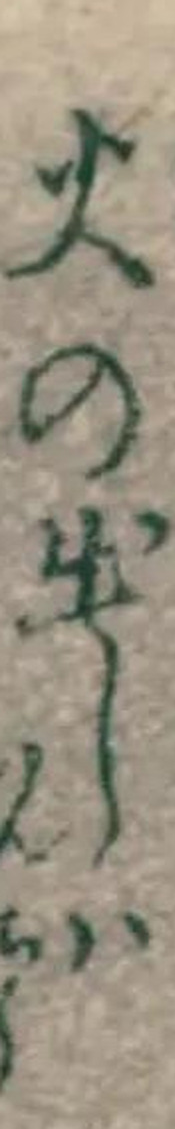火の出しは
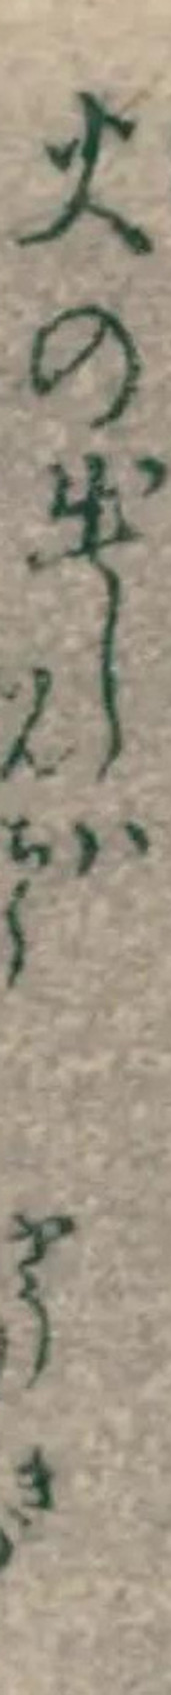火の出しは
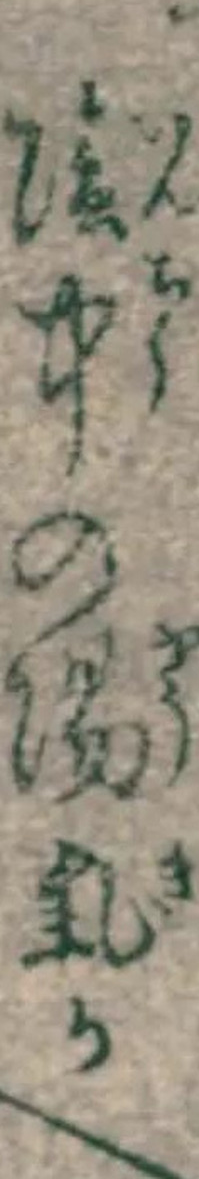陰中の陽気か
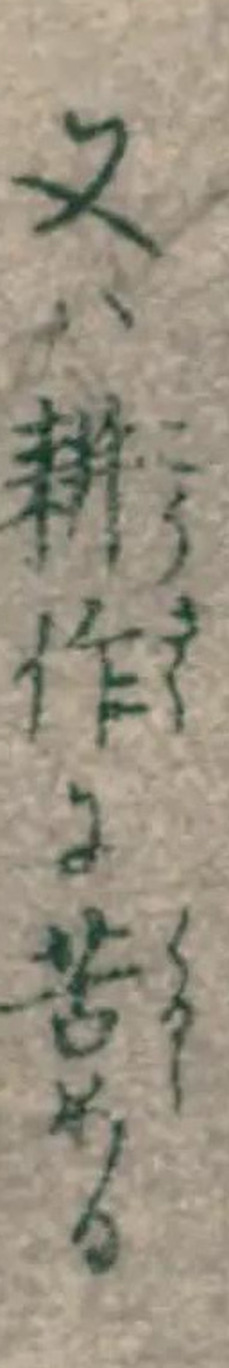又は耕作に苦める
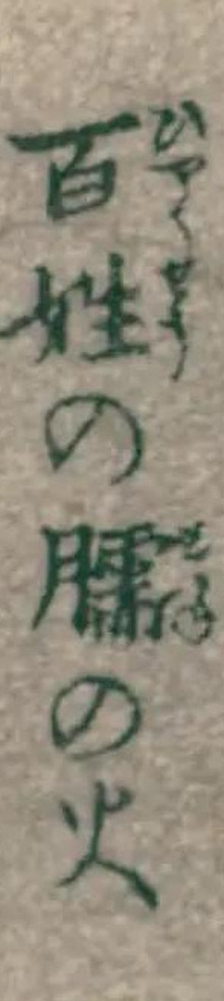百姓の臑の火
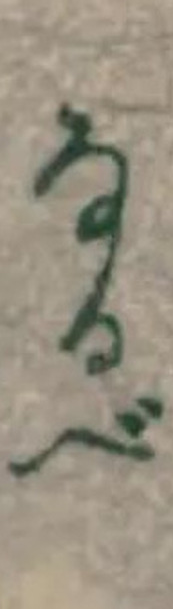なるべ

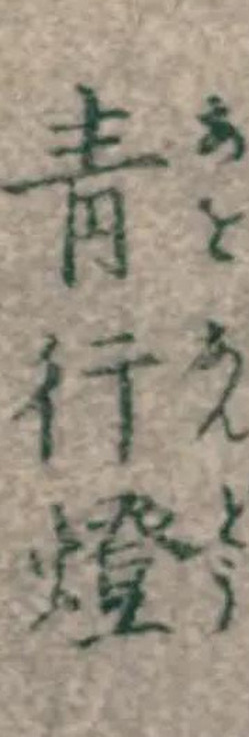青行灯
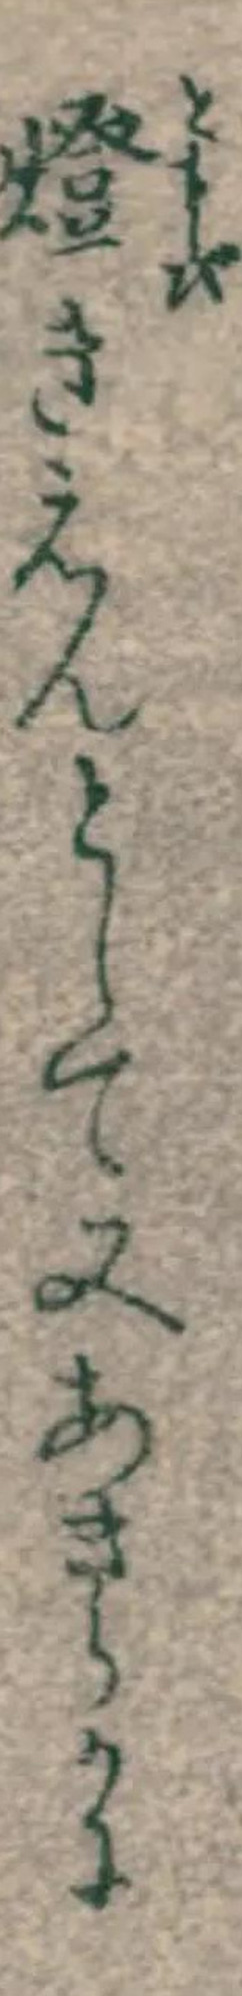灯きえんとして又あきらかに
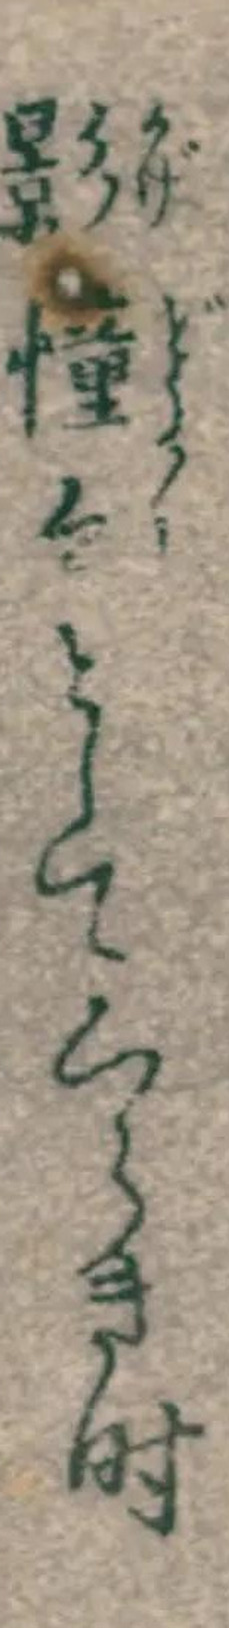影憧々としてくらき時
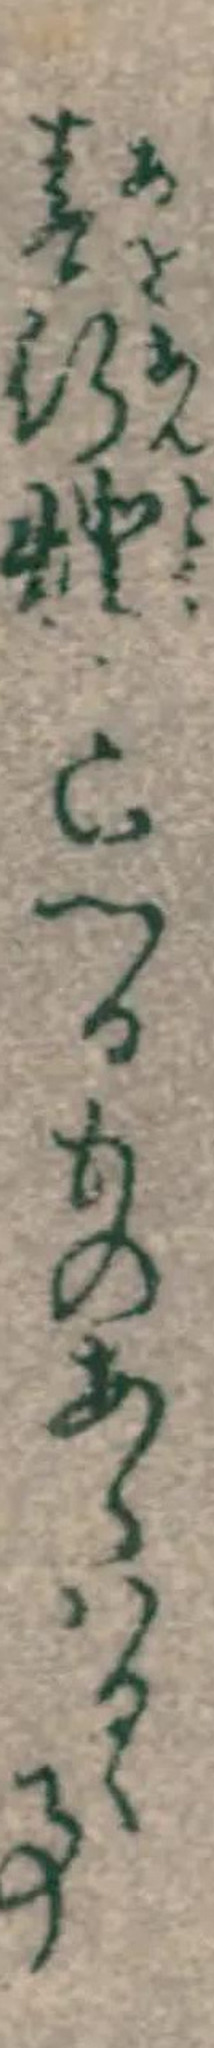青行灯へるものあらはるゝ事
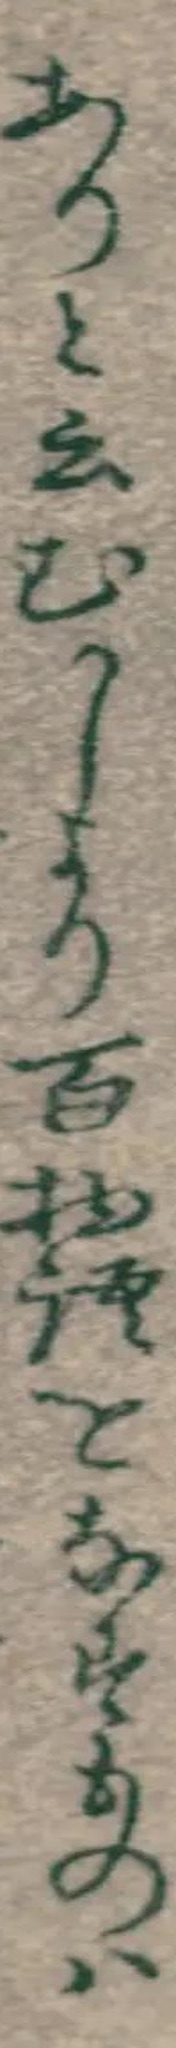ありと云むかしより百物語をなすものは
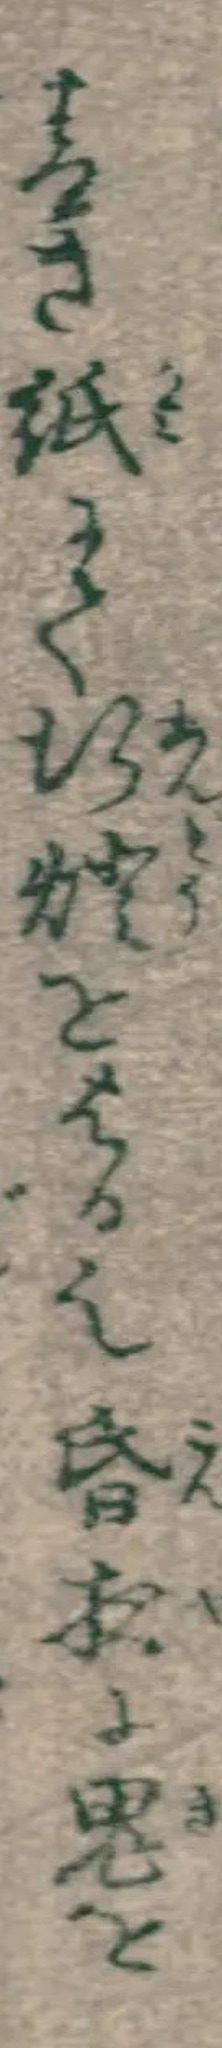青き紙にて行灯をはる也昏夜に鬼を
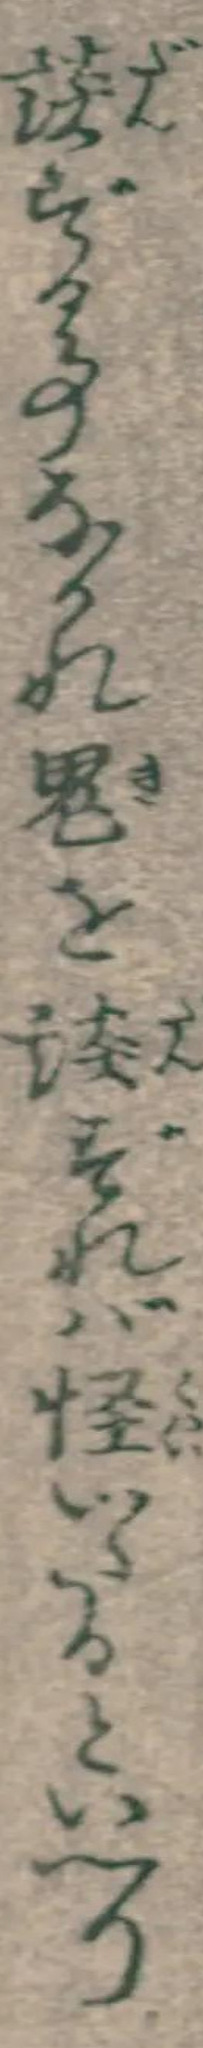談ずる事なかれ鬼を談ずれば怪いたるといへり
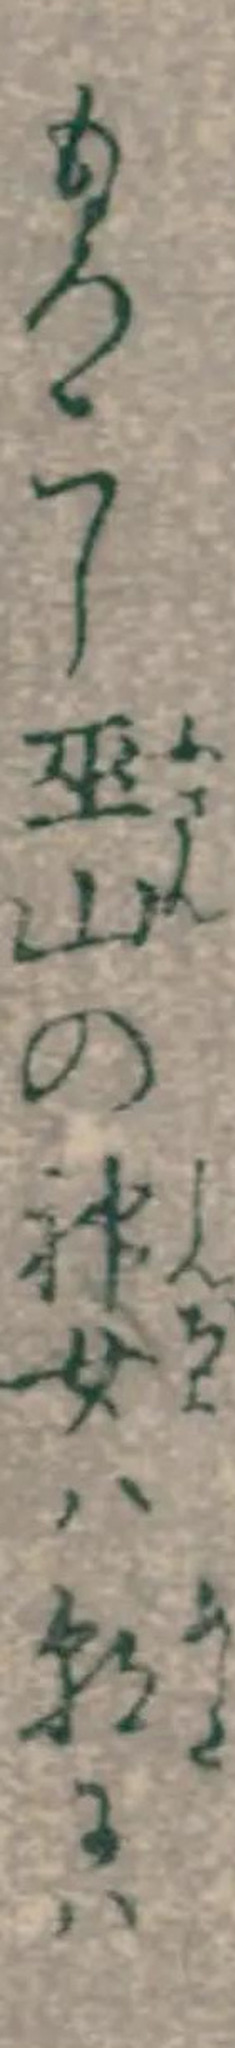もろこし巫山の神女は朝には
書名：百鬼夜行 3巻拾遺3巻. [2]
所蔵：国立国会図書館 National Diet Library, JAPAN
